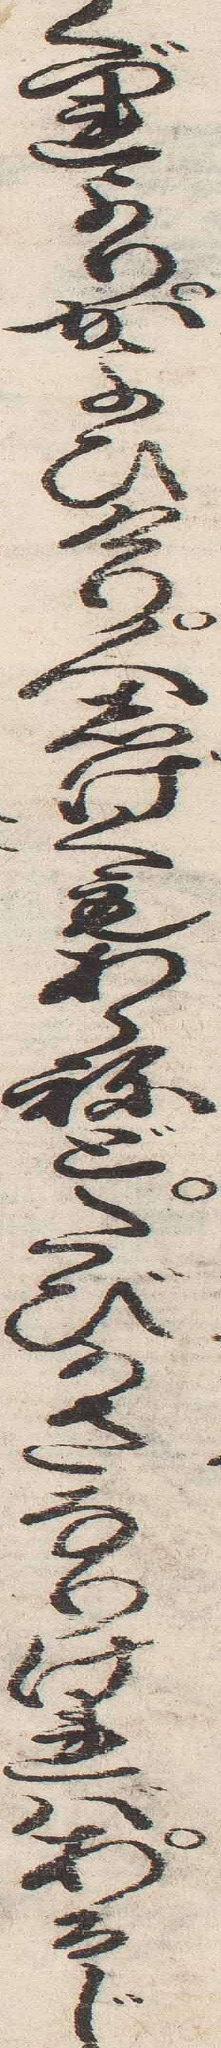くづれより。かよひけり。人しげくもあらねど。たびかさなりければ。あるじ
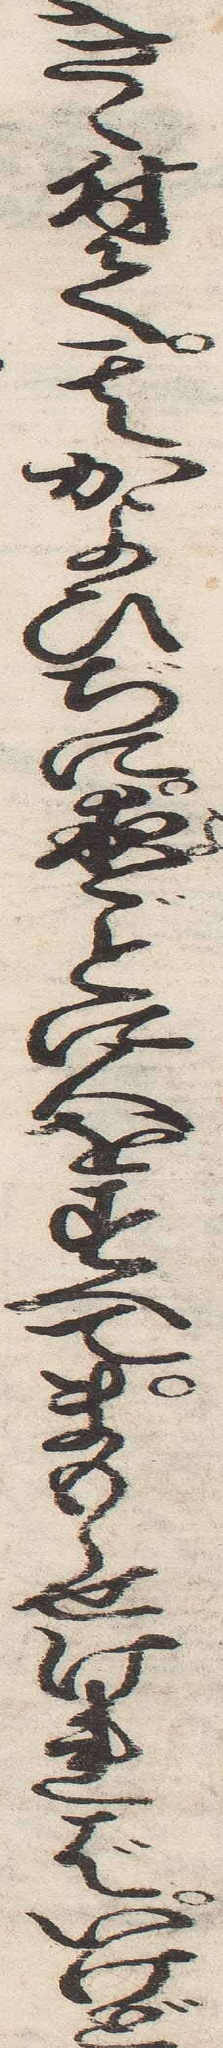きゝ付て。其かよひぢに。夜ごとに人をすへて。まもらせければ。いけど
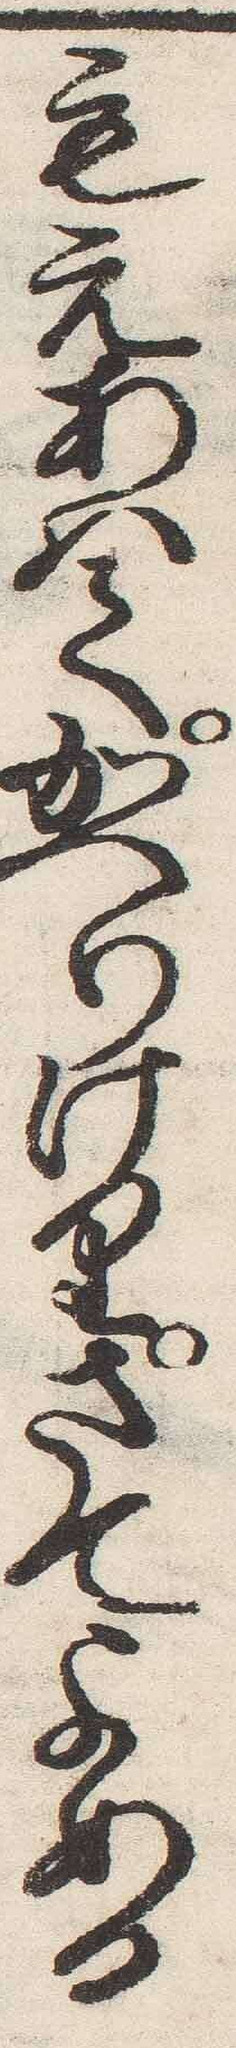もえあはて。かへりけり。さてよめる
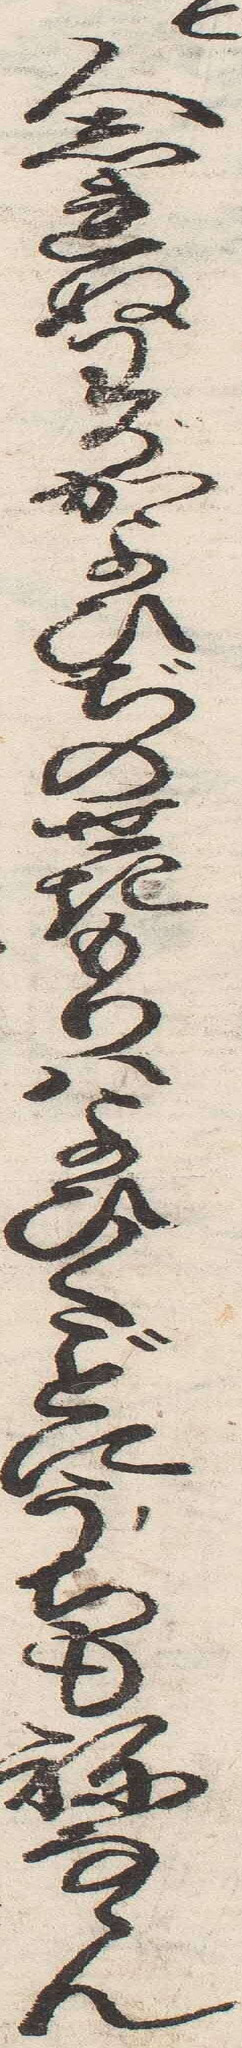古今人しれぬわがかよひぢのせきもりはよひ〳〵ごとにうちもねなゝん
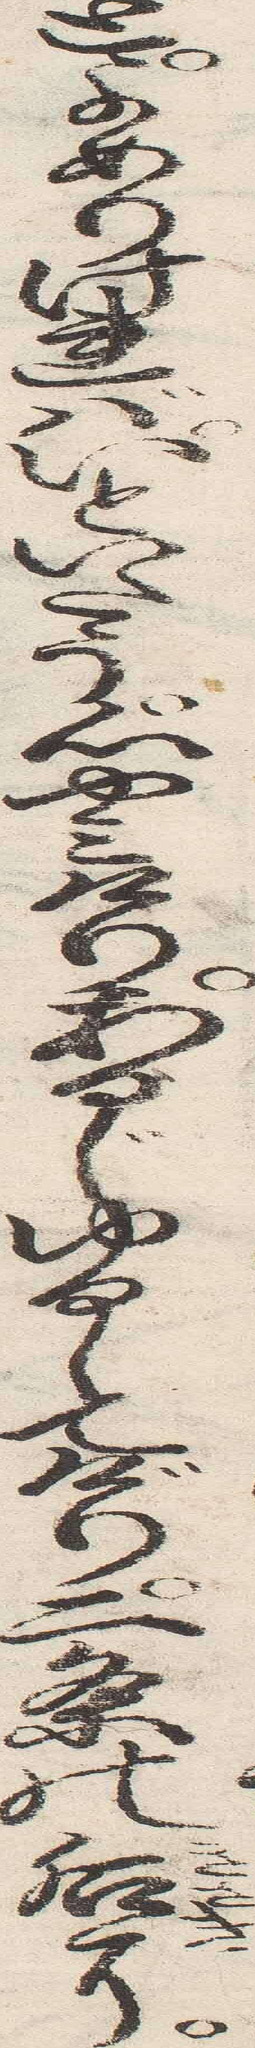と。よめりければ。いといたう。心やみけり。あるじゆるしてげり。二条の后に。
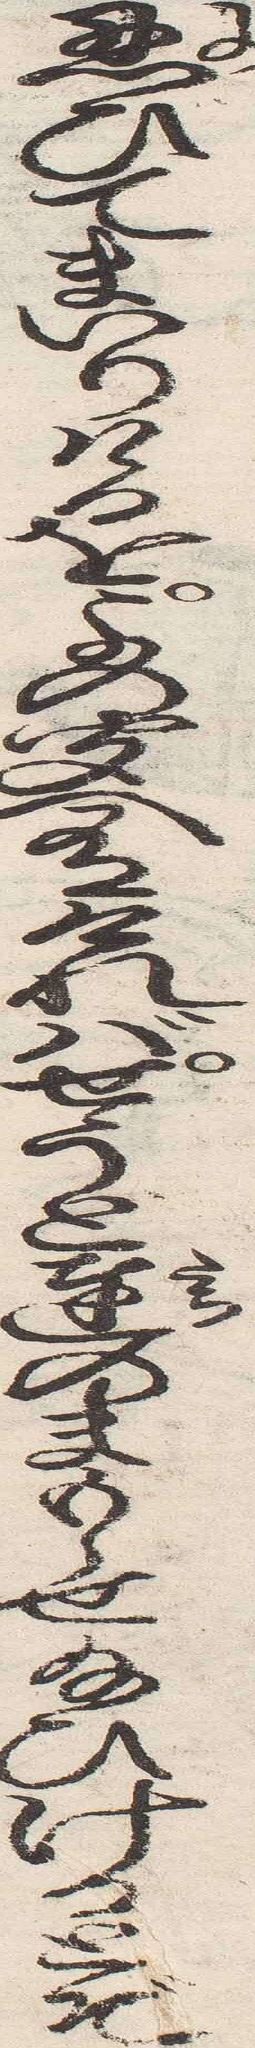忍びてまいりけるを。よの聞へ有ければ。せうと達のまもらせ給ひけるとぞ
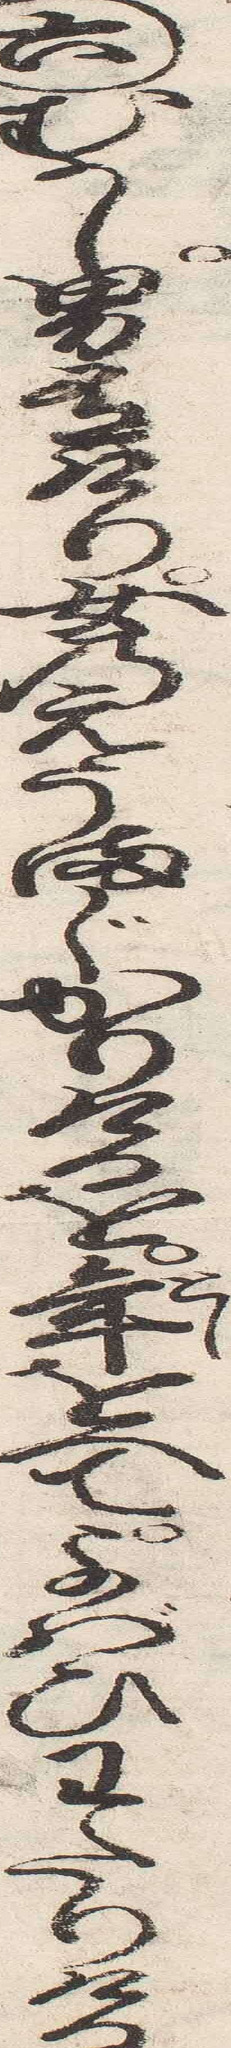㊅むかし。男有けり。女のえうまじかりけるを。年をへて。よばひわたりける
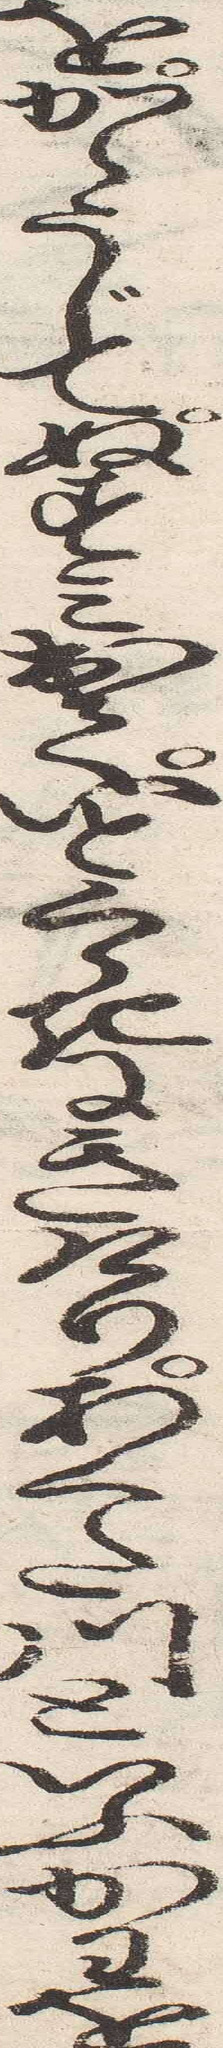を。からうじて。ぬすみ出て。いとくらきにきけり。あくた川といふかわを
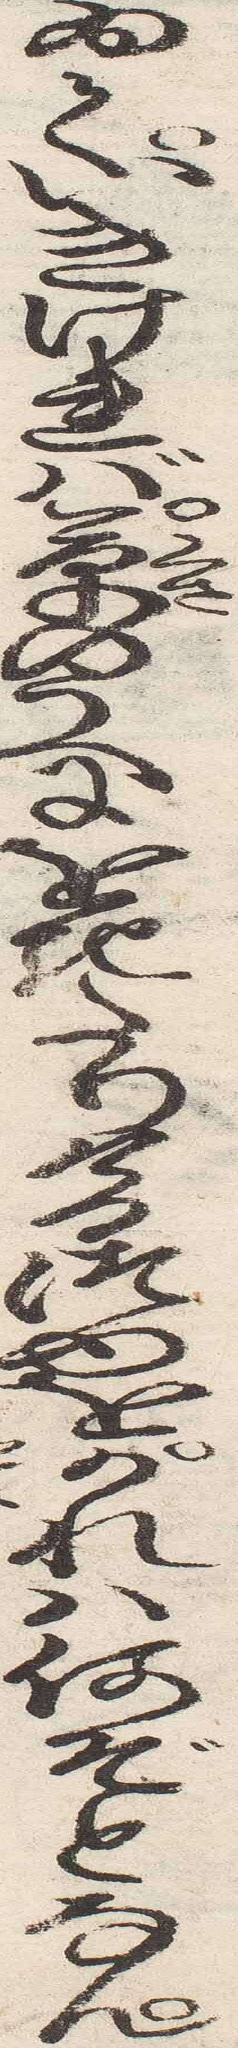ゐて。いきければ。草のうへにをきたりけるつゆを。かれは何ぞとなん。
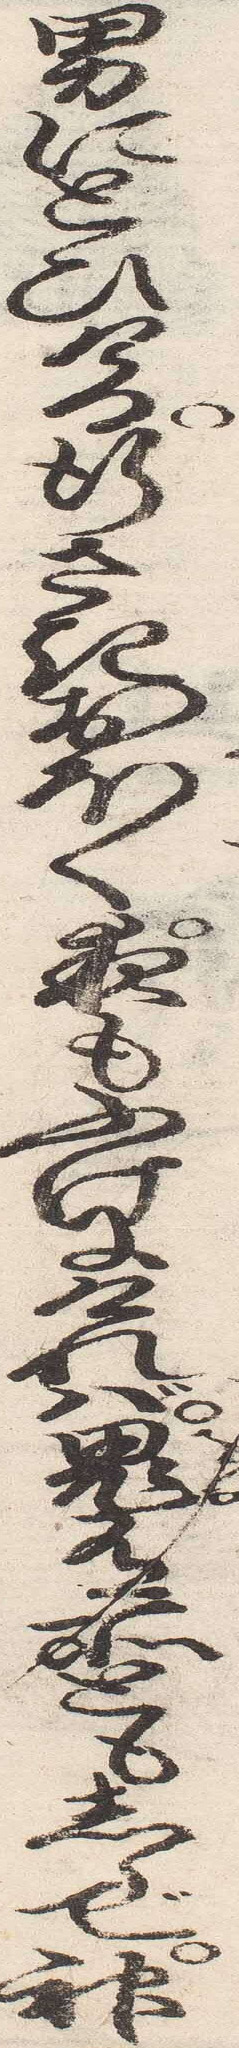男にとひける。行さきおほく。夜もふけにければ。鬼有所ともしらで。神
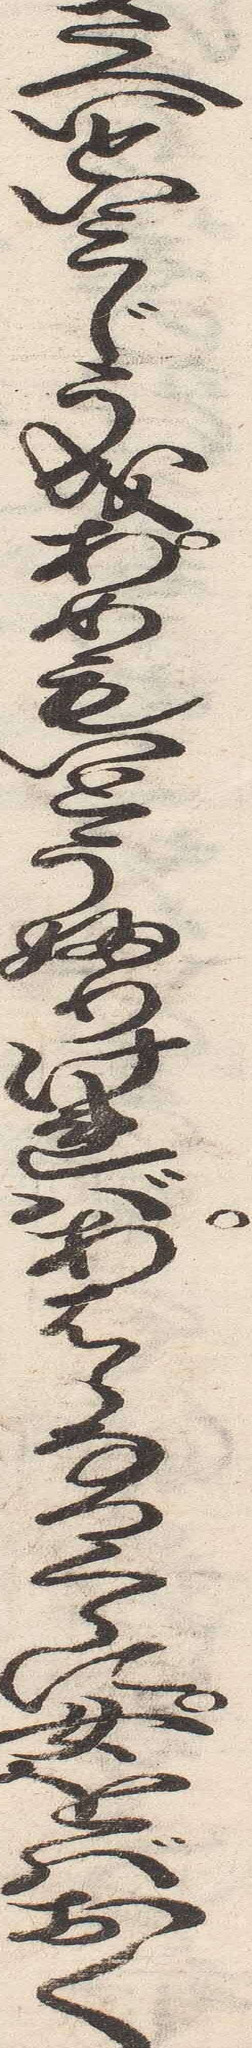さへいといみじう成。あめもいとうふりければ。あはらなるくらに。女をばおく
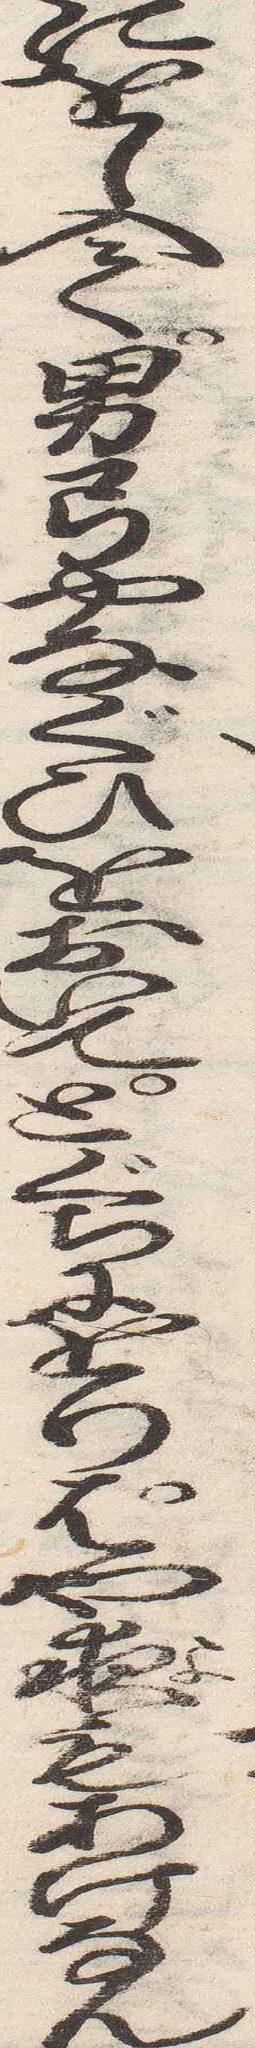にをし入て。男弓やなぐひをおいて。とぐちにをり。はや夜もあけなん
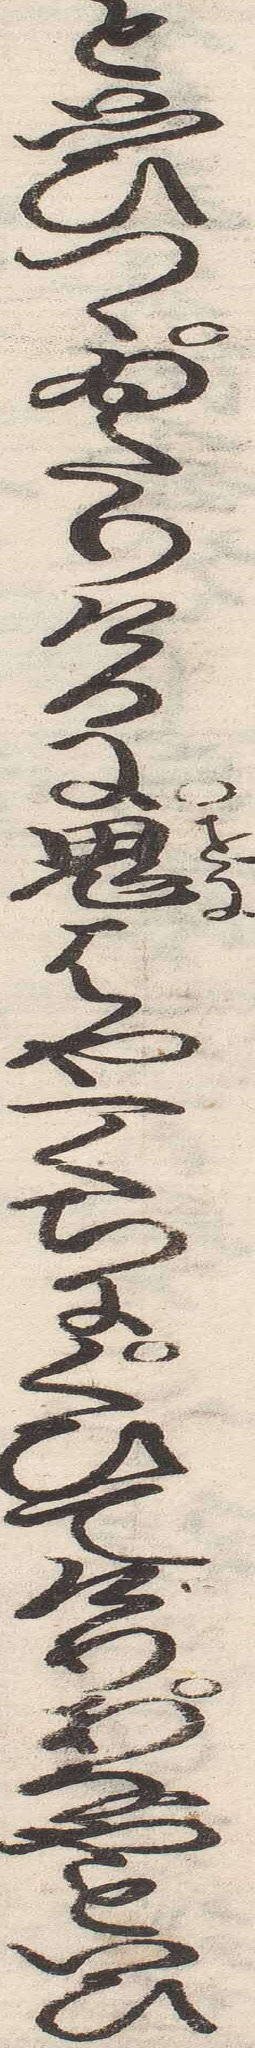と思ひつゝ。ゐたりけるに。鬼はや一くちに。くひてげり。あなやといひ
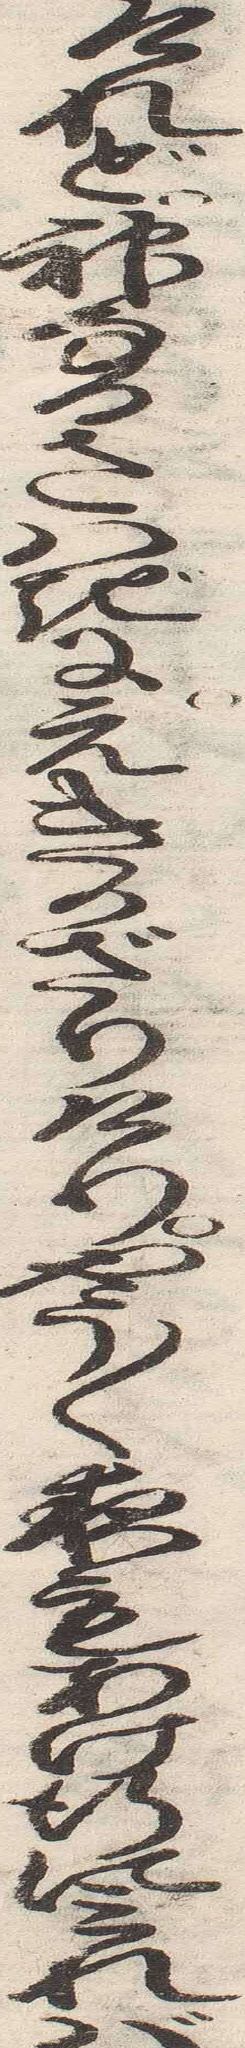けれど。神なるさはぎに。えきかざりけり。やう〳〵夜もあけ行にみれば
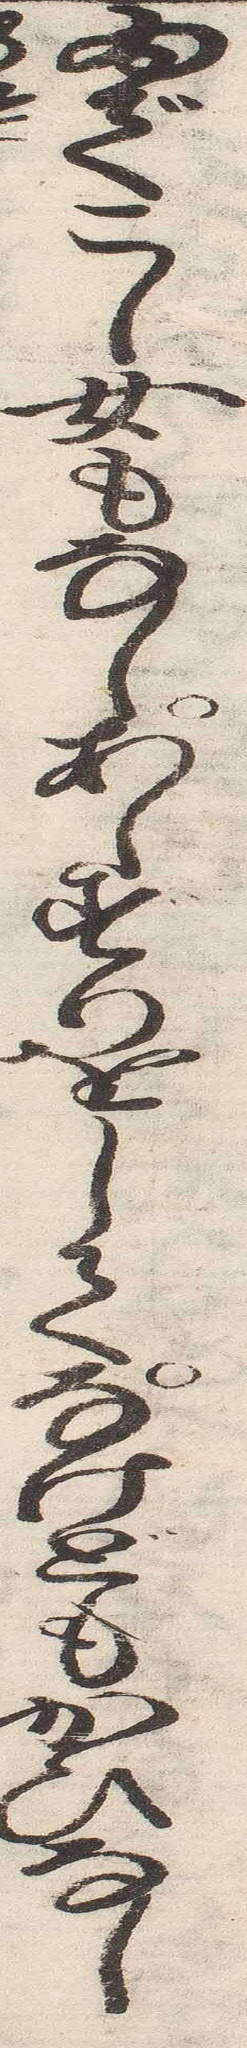ゐでこし女もなし。あしずりをして。なけどもかひなし
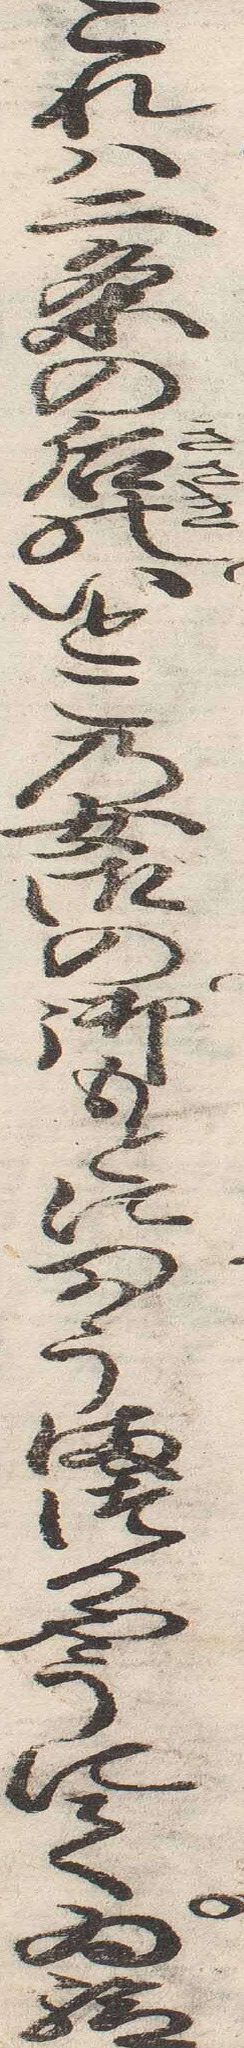これは二条の后の。いとこの女御の。御もとにつかうまつるやうにて。ゐ給
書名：伊勢物語
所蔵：東京学芸大学附属図書館 国文学研究資料館
